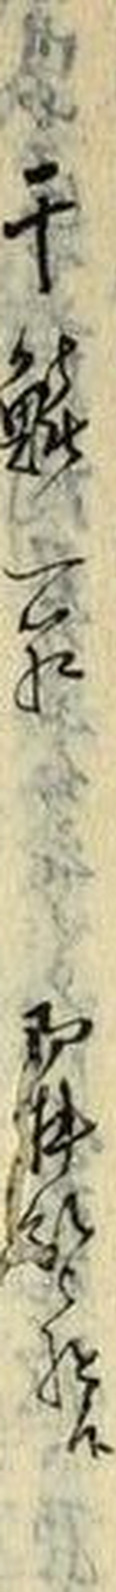干鱚一箱御拝領被遊候
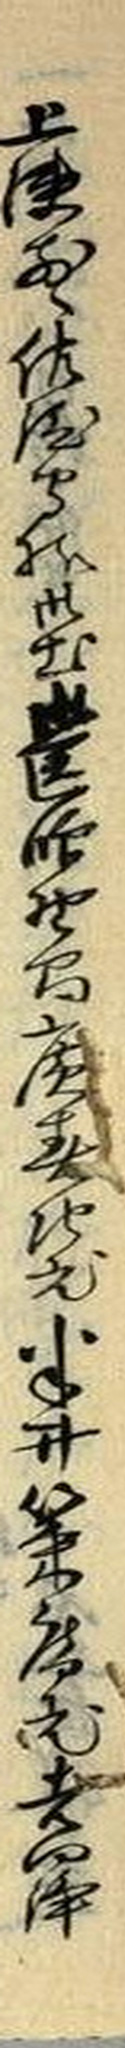上使前へ佐渡守様御出御医師野間広春院老半井策庵老吉田浄
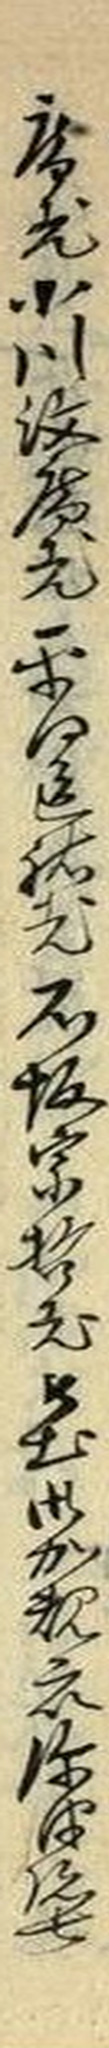庵老小川汶庵老平田道祐老石坂宗哲老被出御加規衆深津弥七
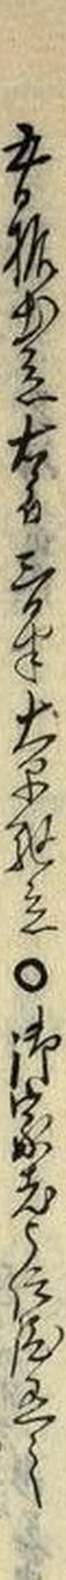五日振出立右ニ付三日半大早駆立〇御家老被仰渡有之
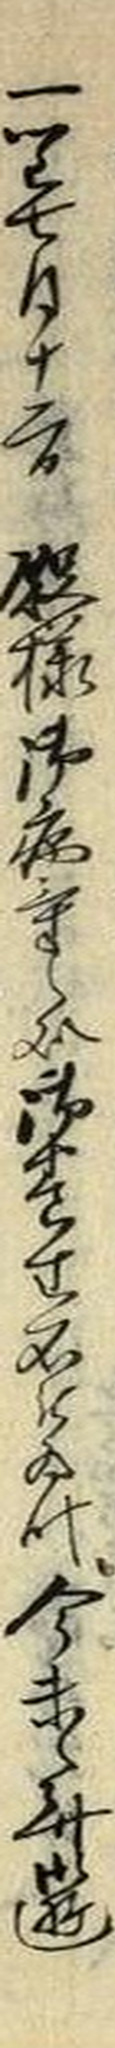一閏七月十二日殿様御病気之処御養生不被為叶今未之刻御逝
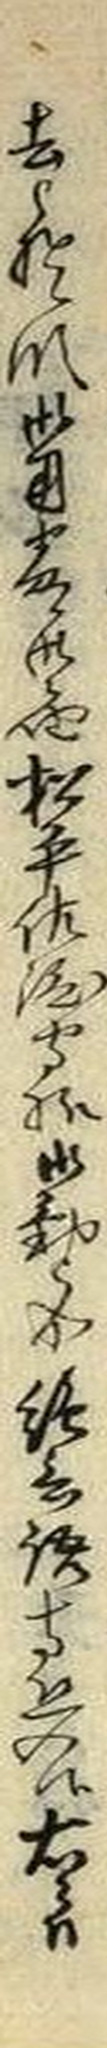去被遊候段御用番へ御届松平佐渡守様御勤被成絶言語奉恐入候右ニ付
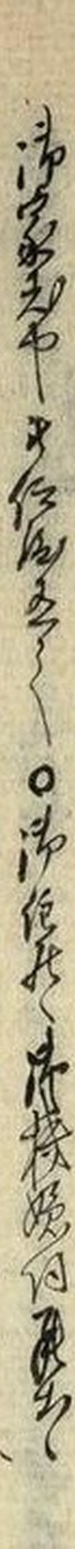御家老中被仰渡有之〇御住居へ御機嫌伺罷出候
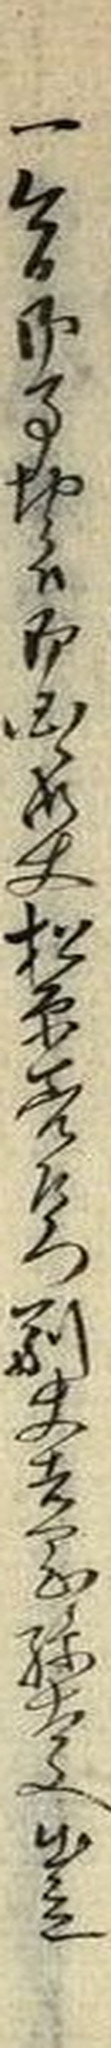一今日御事切ニ付御国へ御使松原善左衛門副使吉岡孫太夫出立
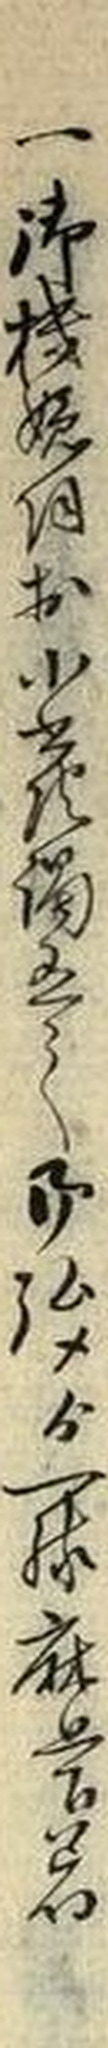一御機嫌伺於小書院謁有之御弘メゟ一統麻上下着
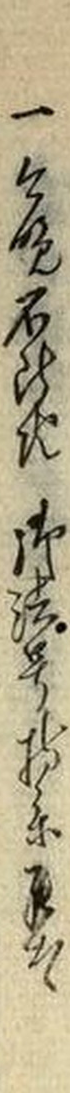一今晩不断院御法号持参罷出候
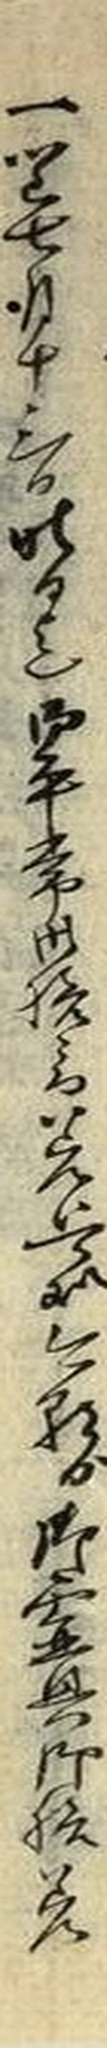一閏七月十三日昨日迄御平常御膳ニ而差上候処今朝ゟ御霊具御膳差
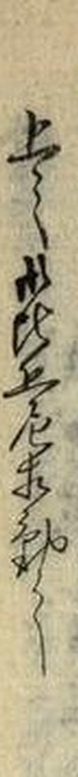上之御比丘尼相勤之

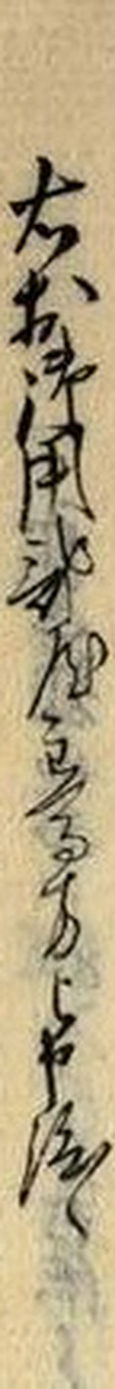右於御用部屋主馬方被申渡候
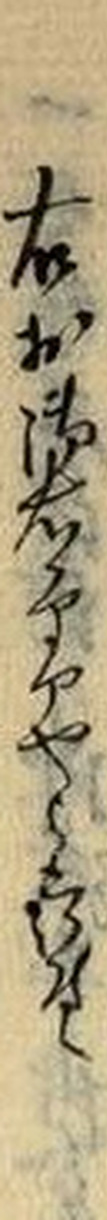右於御右筆部や被仰付候
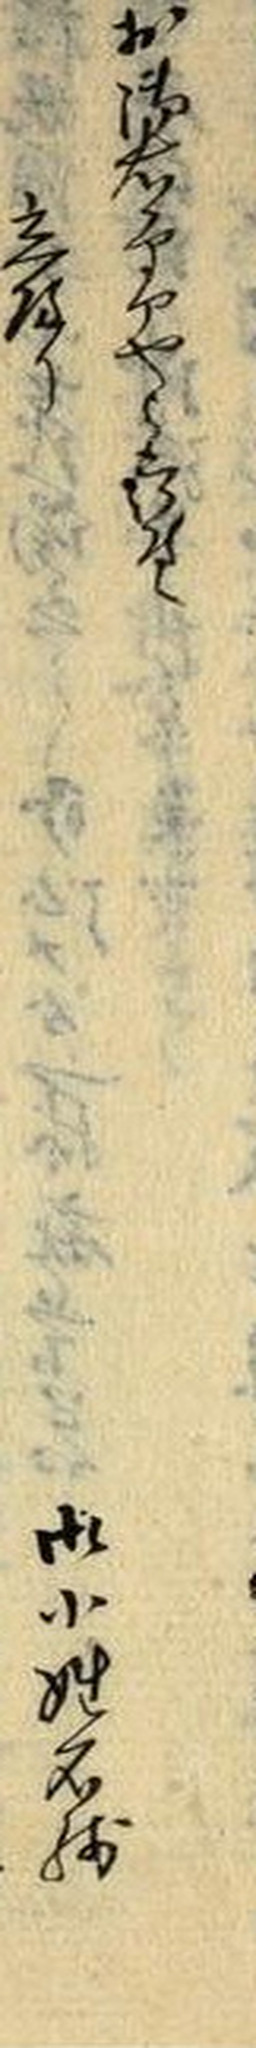立帰り御小姓不残
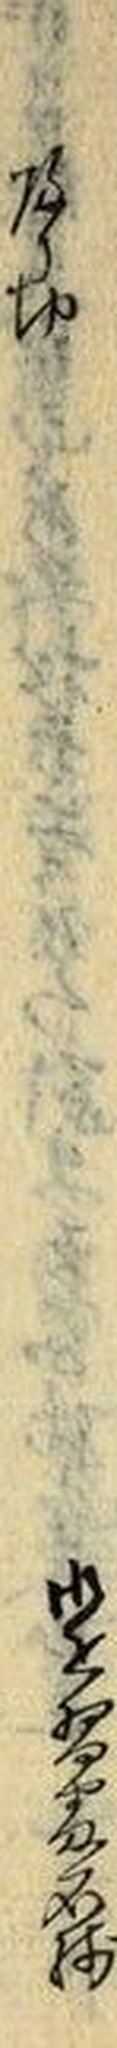帰り切御近習番不残
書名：少傅日録抄（斉承付側向頭取日記、在府）
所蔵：福井県文書館 Fukui Prefectural Archives
